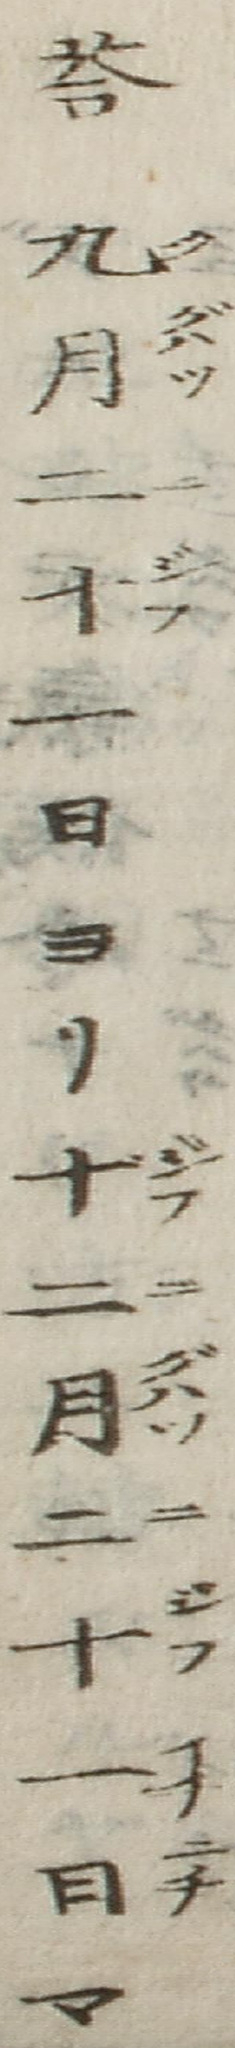答九月二十一日ヨリ十二月二十一日マ

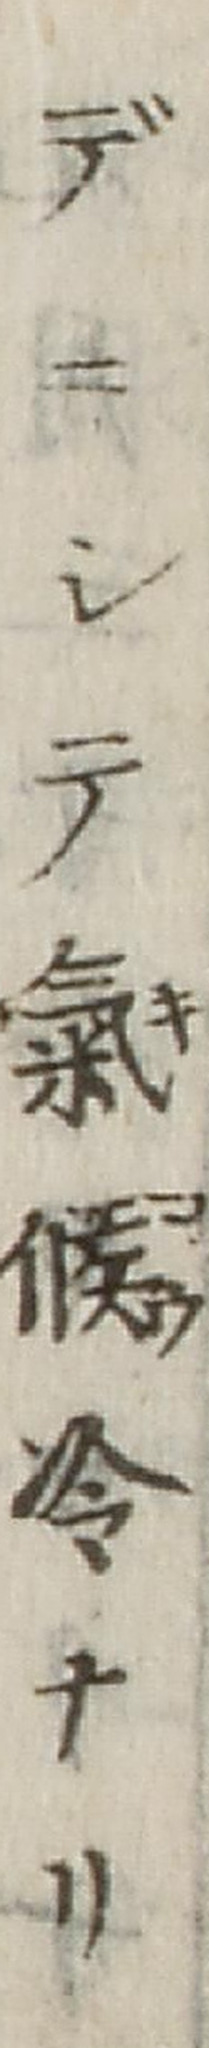デニシテ気候冷ナリ
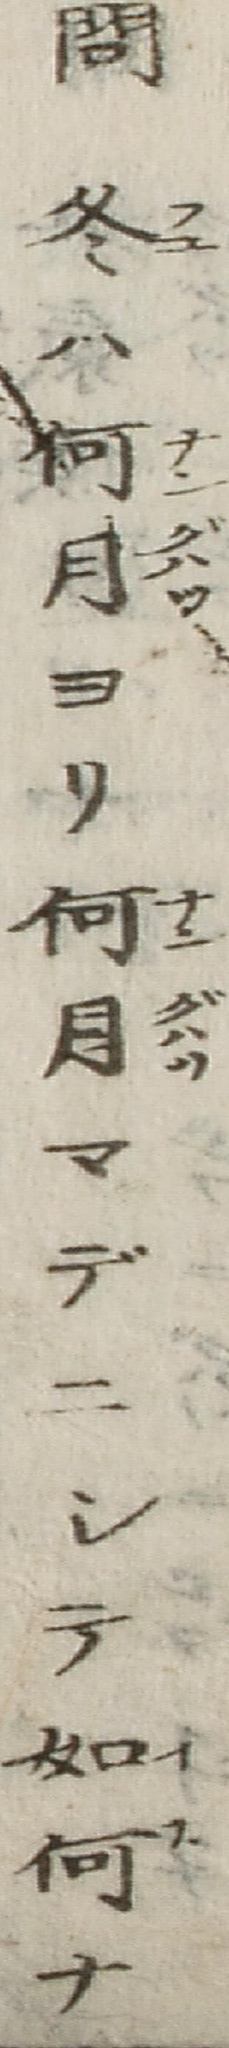問冬ハ何月ヨリ何月マデニシテ如何ナ
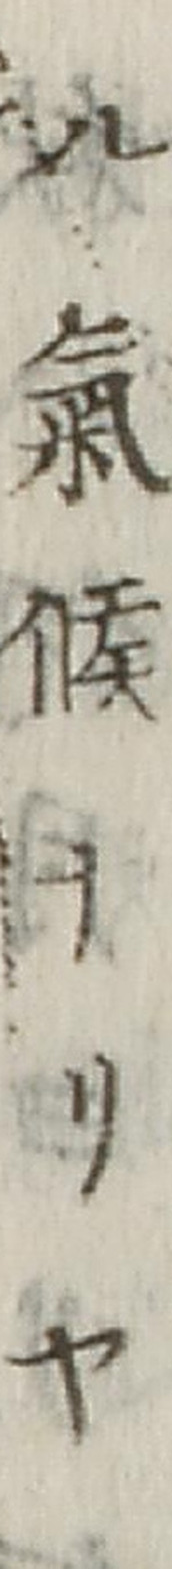ル気候ナリヤ
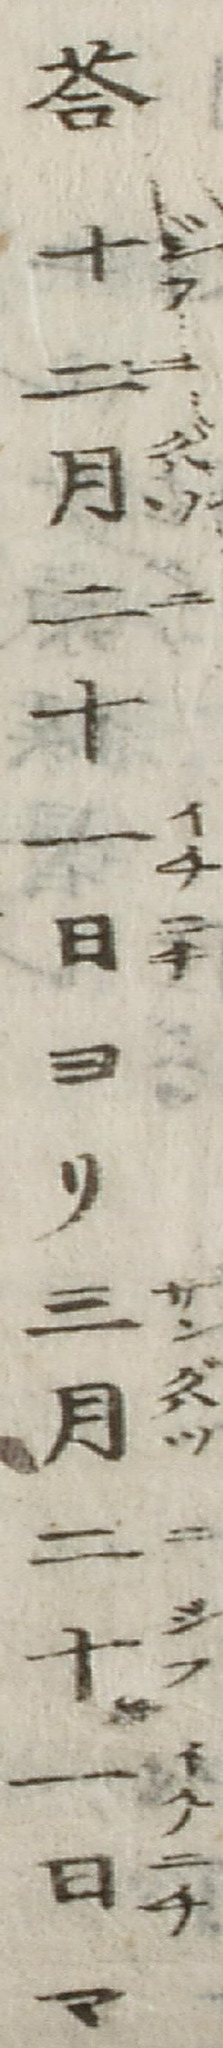答十二月二十一日ヨリ三月二十一日マ
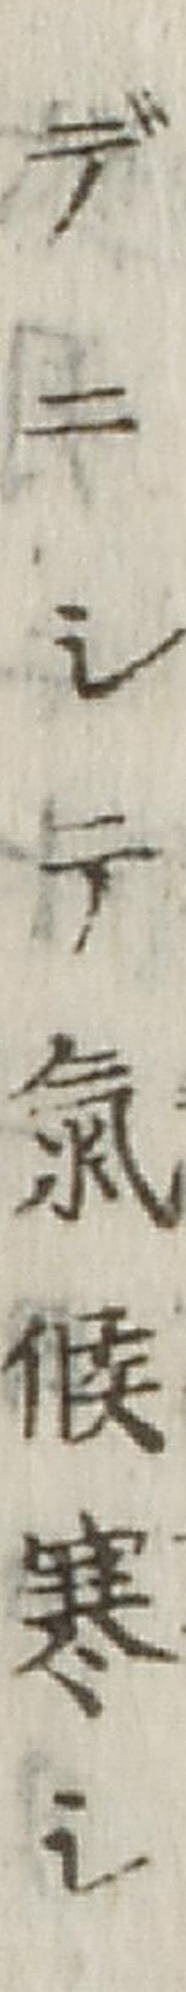デニシテ気候寒シ
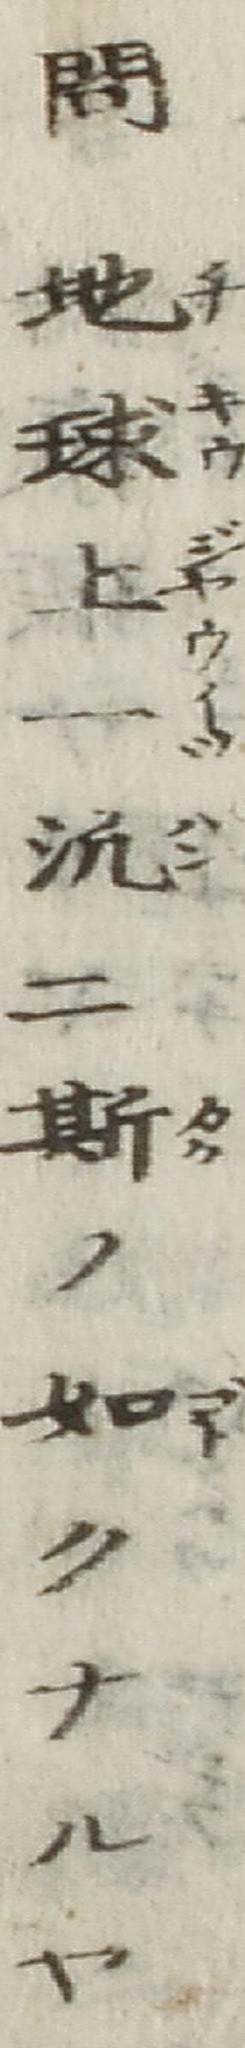問地球上一汎ニ斯ノ如クナルヤ
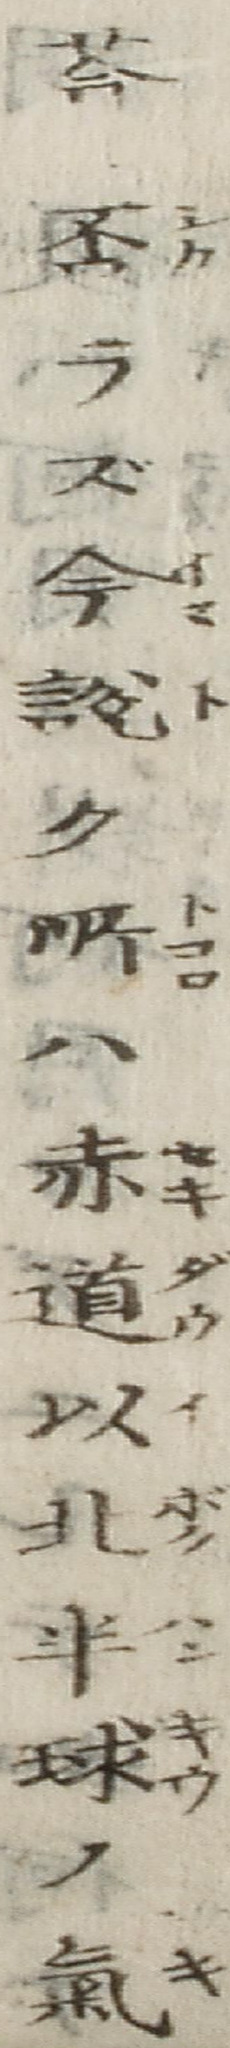答否ラズ今説ク所ハ赤道以北半球ノ気
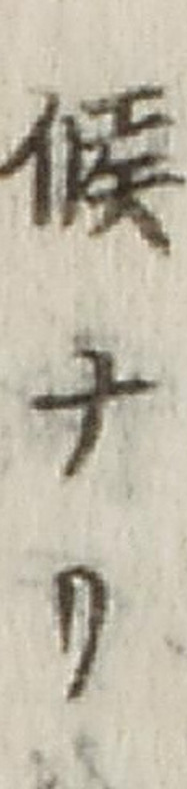候ナリ
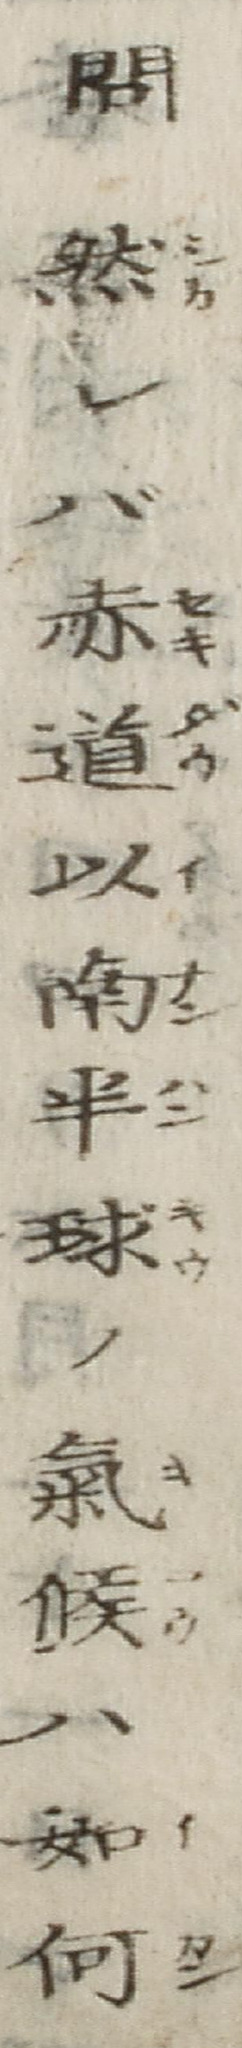問然レバ赤道以南半球ノ気候ハ如何
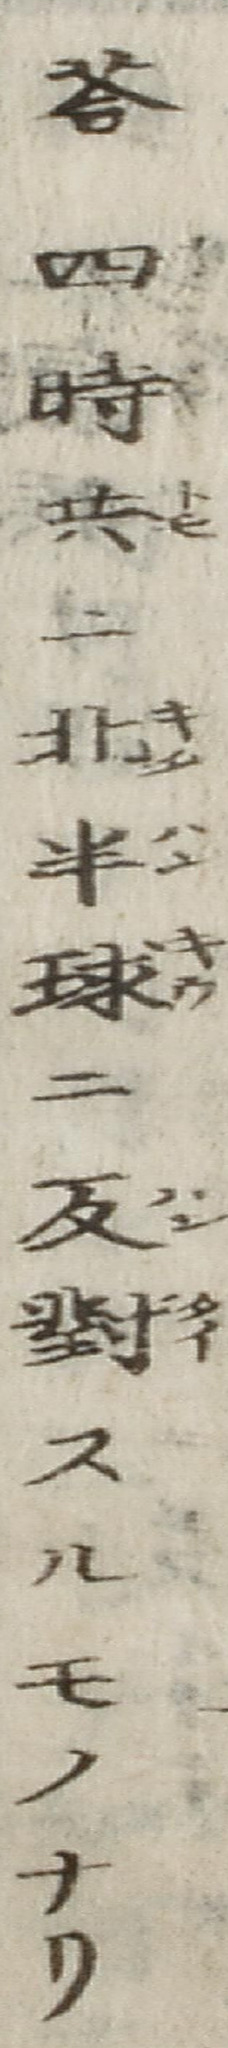答四時共ニ北半球ニ反対スルモノナリ
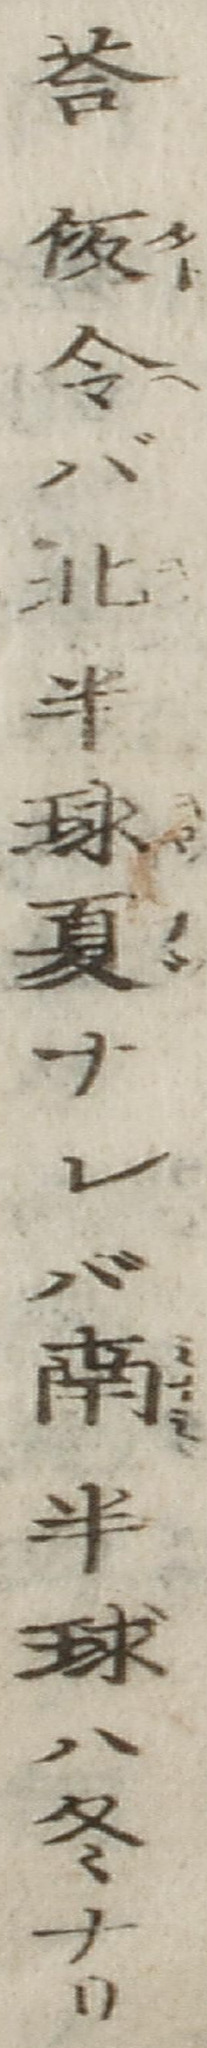答仮令バ北半球夏ナレバ南半球ハ冬ナリ
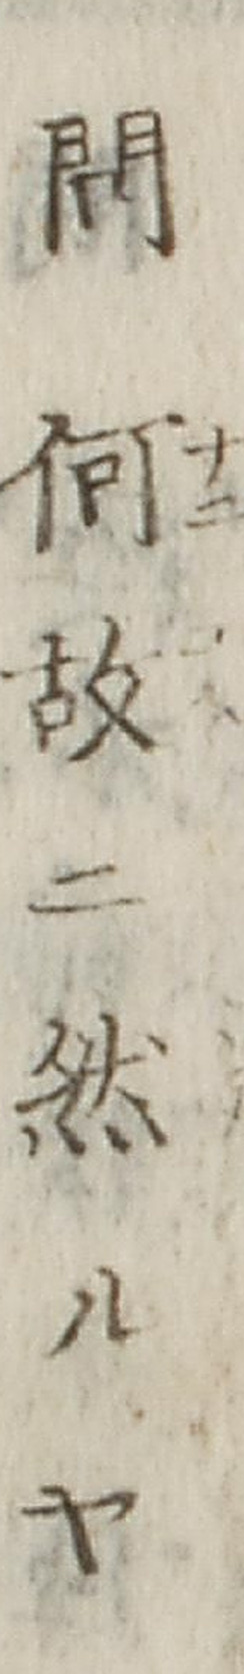問何故ニ然ルヤ
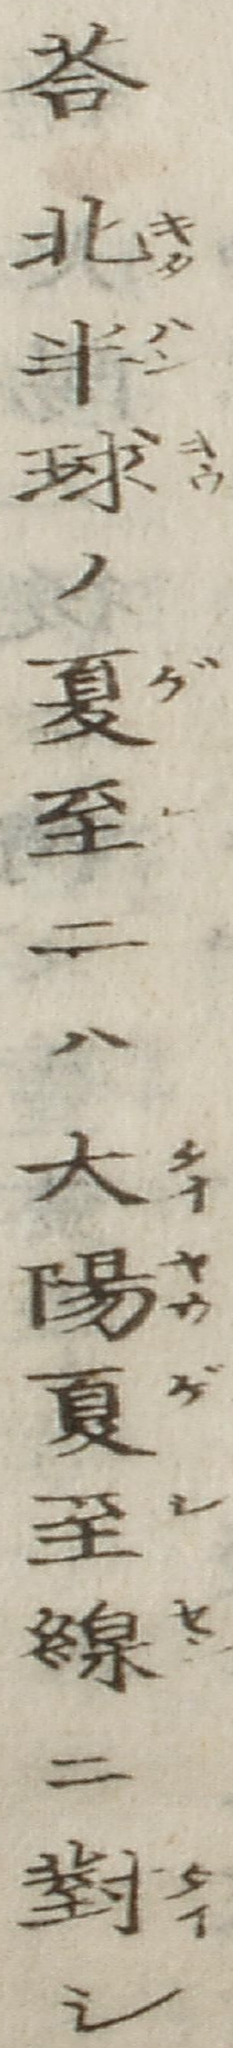答北半球ノ夏至ニハ大陽夏至線ニ対シ
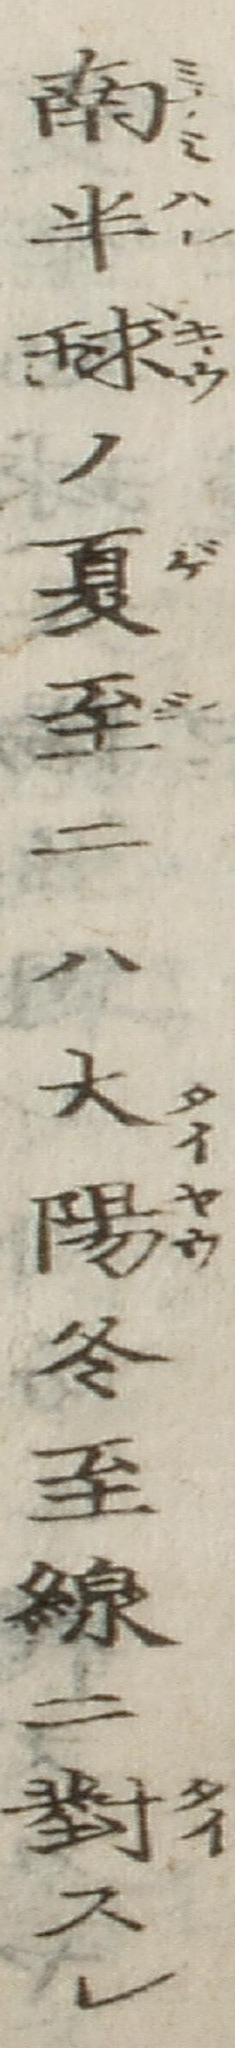南半球ノ夏至ニハ大陽冬至線ニ対スレ
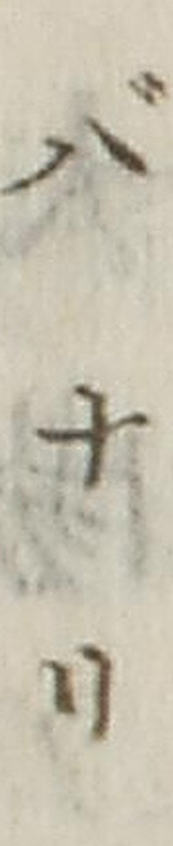バナリ
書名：地球儀問答　全
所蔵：東京大学地震研究所図書室 Earthquake Research Institute Library, The University of Tokyo, JAPAN
